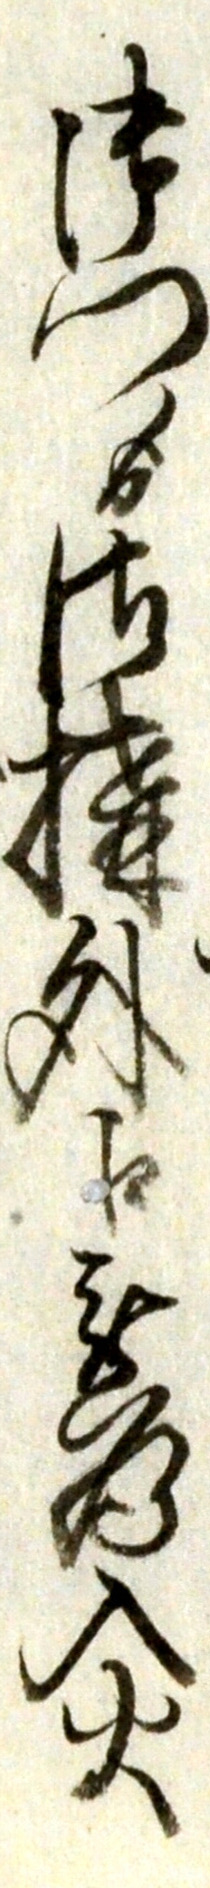御門ゟ御構外え被為入火
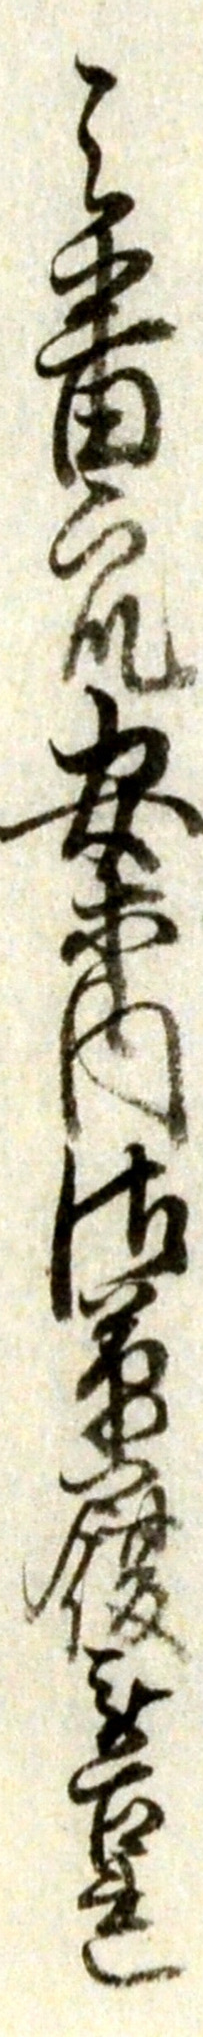之番衆案内御草履被召連
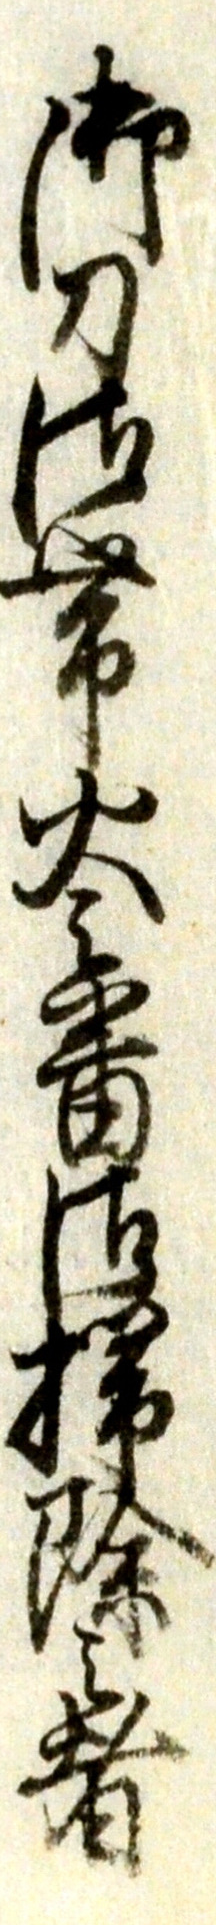御刀御帯火之番御掃除之者
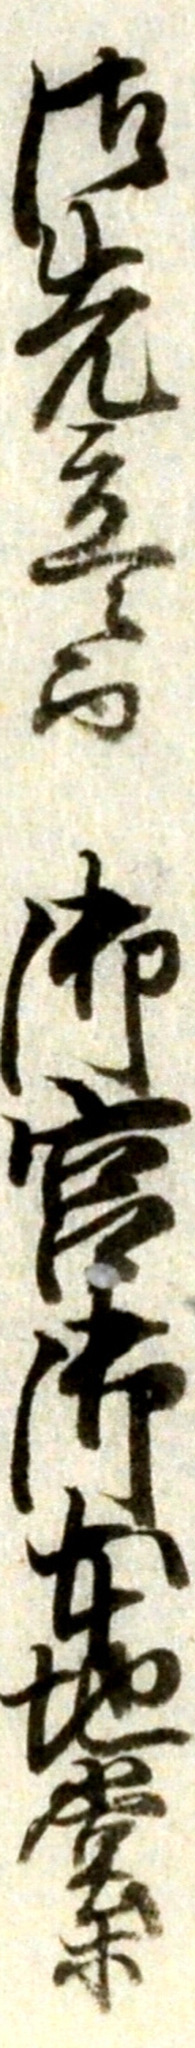御先立ニ而御宮御本地堂等
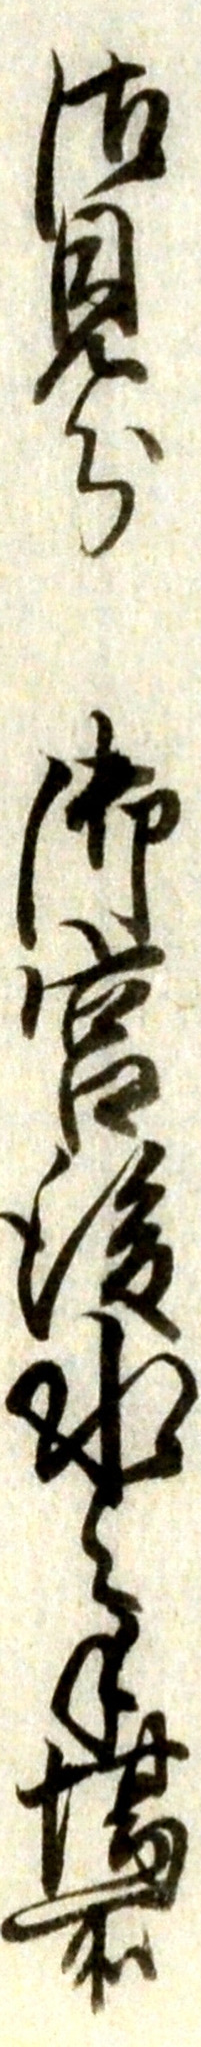御見分御宮後水之手場所
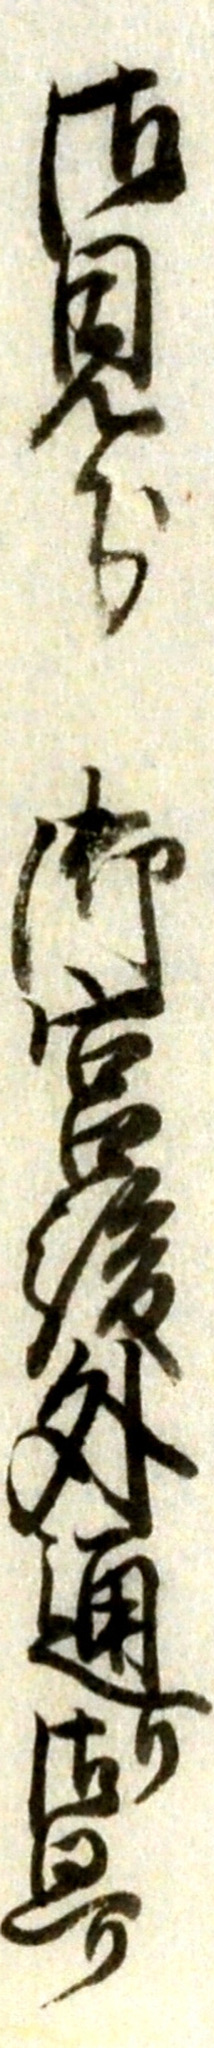御見分御宮後外通り御廻り
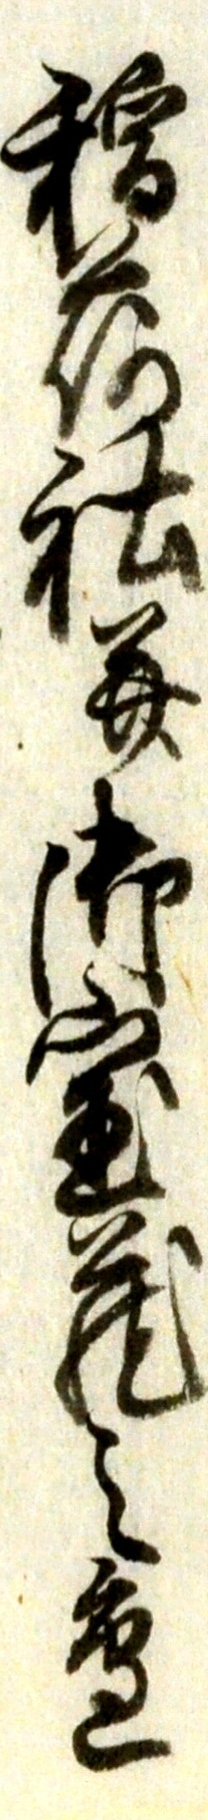稲荷社并御宝蔵之辺
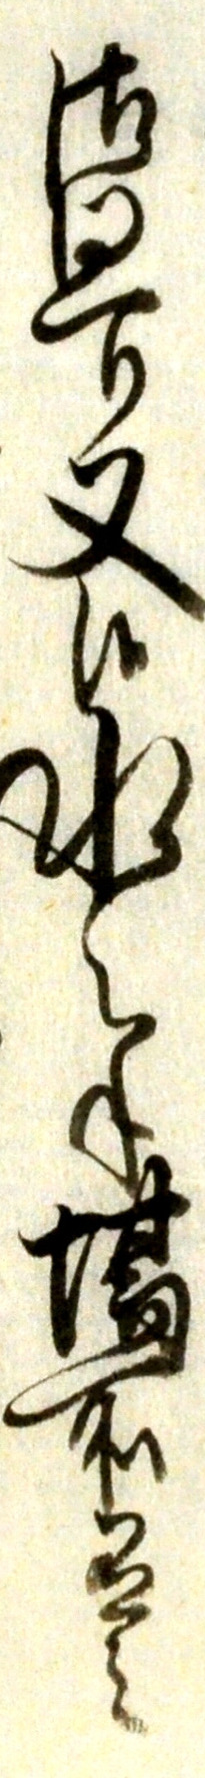御廻り又候水之手場所有之
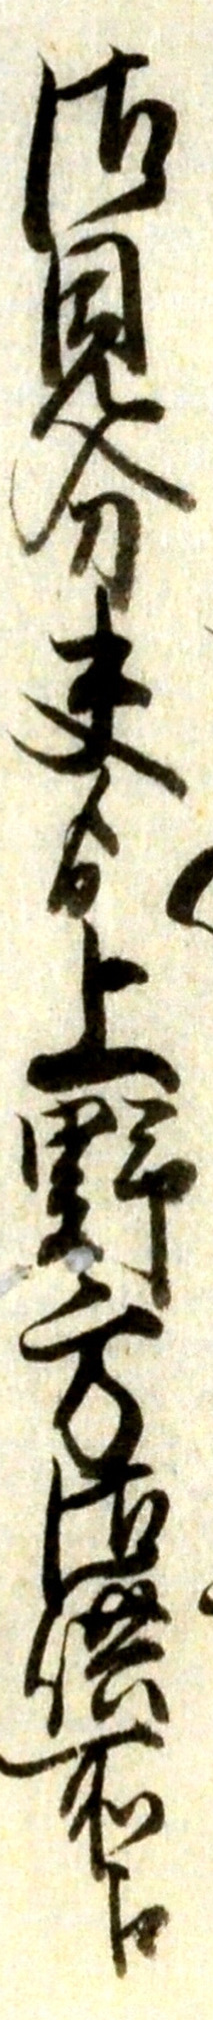御見分夫ゟ上野方御供所え
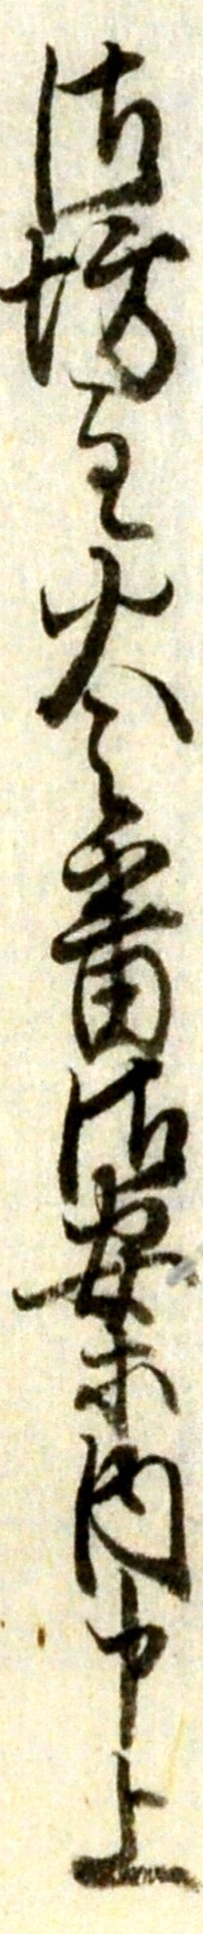御坊主火之番御案内申上
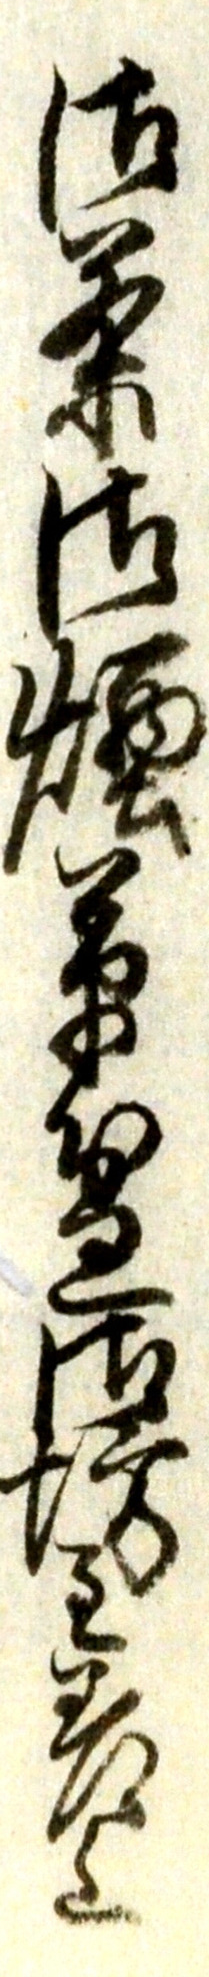御茶御煙草盆御坊主差上
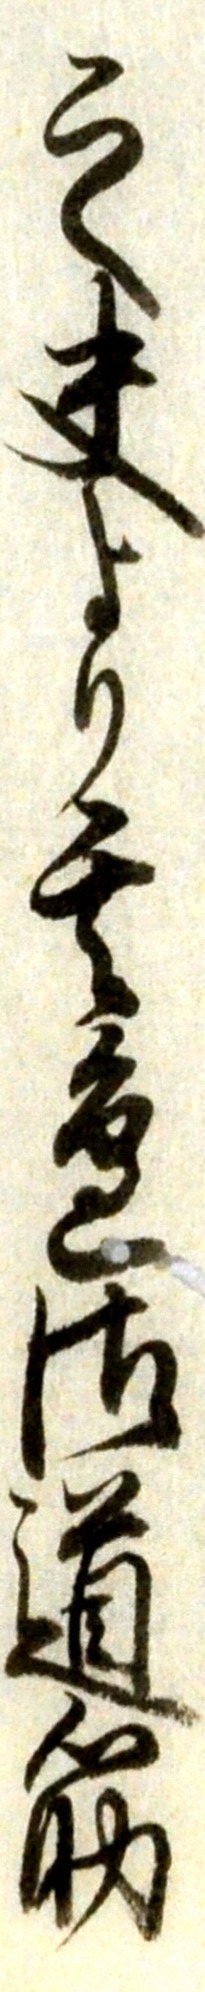之夫より其辺御道筋
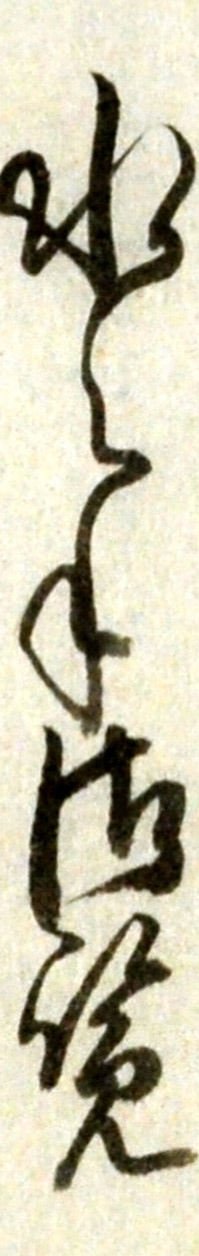水之手御覧
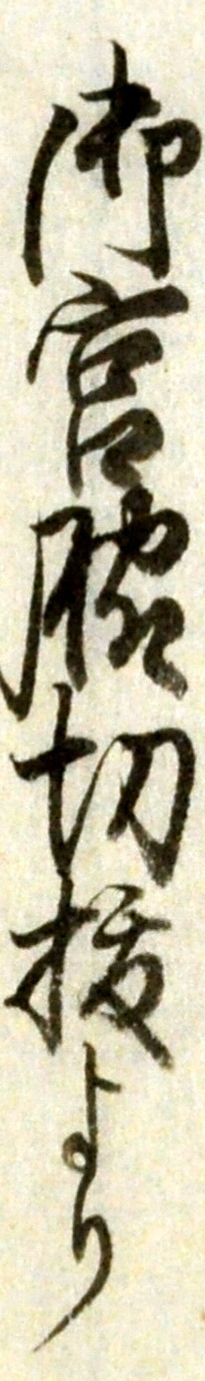御宮脇切抜より

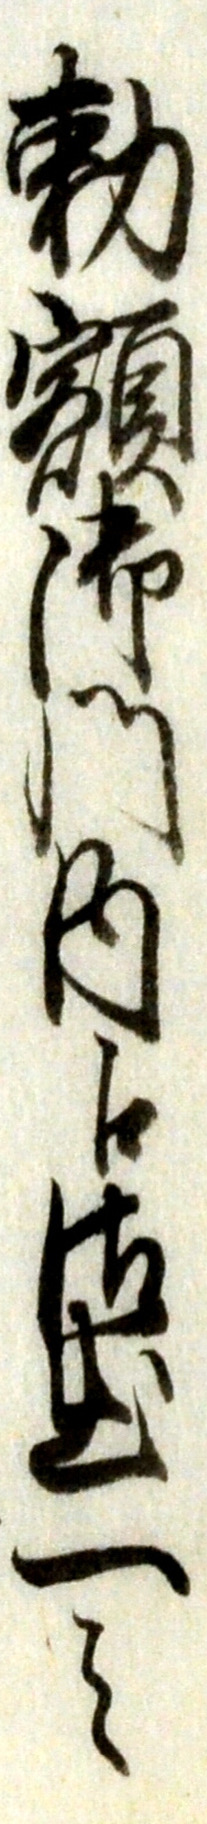勅額御門内え御出一之
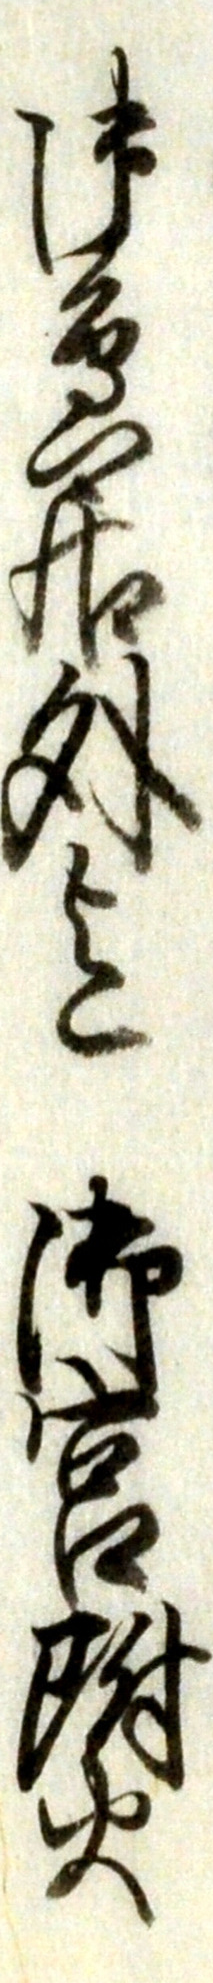御鳥居外迄御宮附火
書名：紅葉山御見分ノ節ノ御書付
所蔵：伊那市立高遠町図書館・合同会社AMANE
